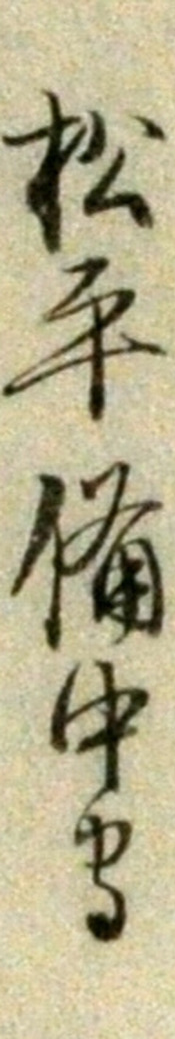松平備中守
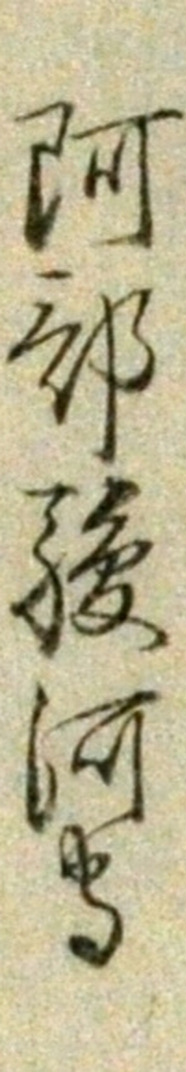阿部駿河守
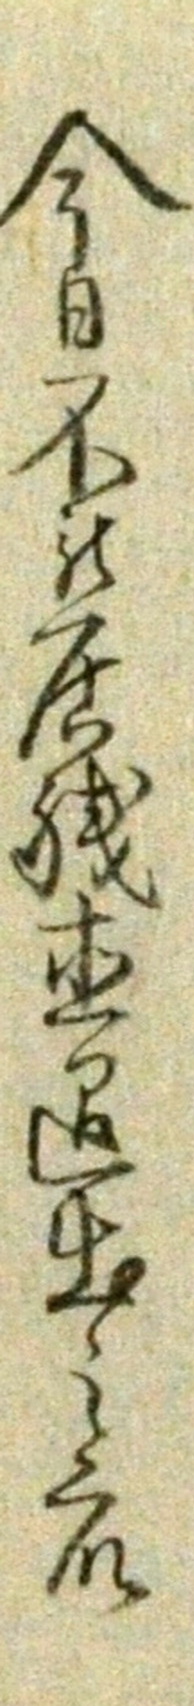今日不被居残直退出之衆
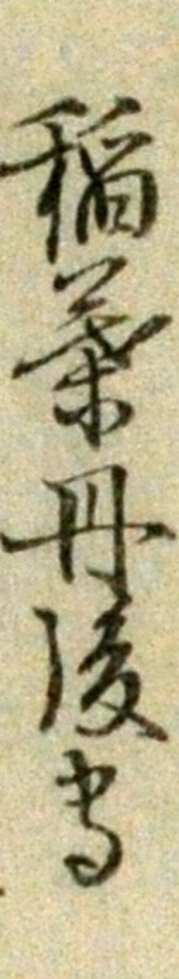稲葉丹後守
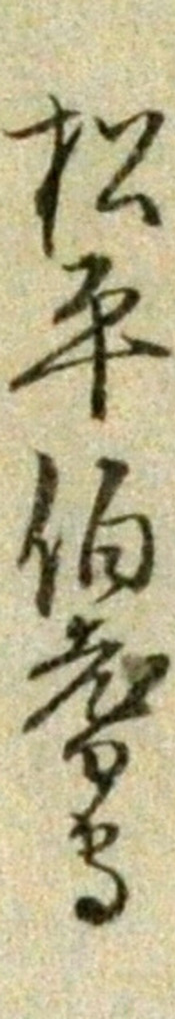松平伯耆守
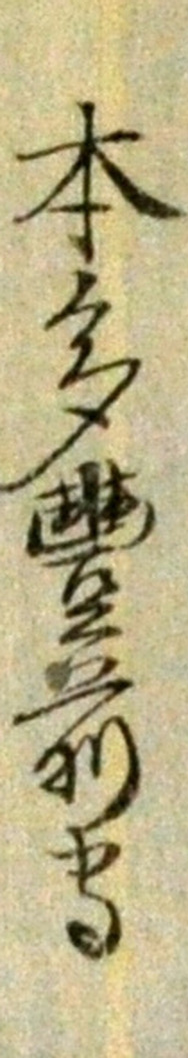本多豊前守
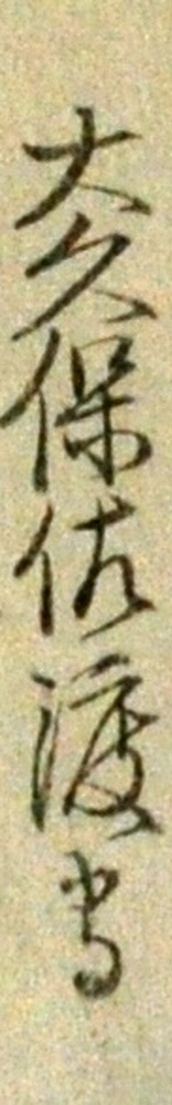大久保佐渡守
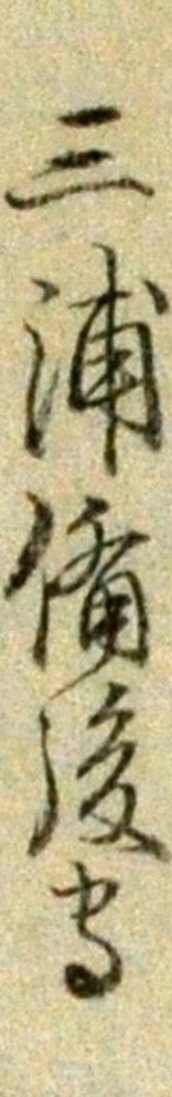三浦備後守
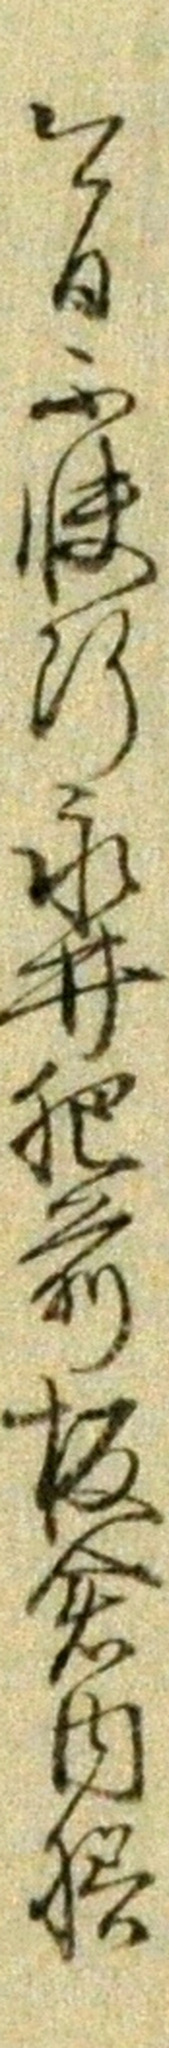今日不快断永井肥前板倉内膳
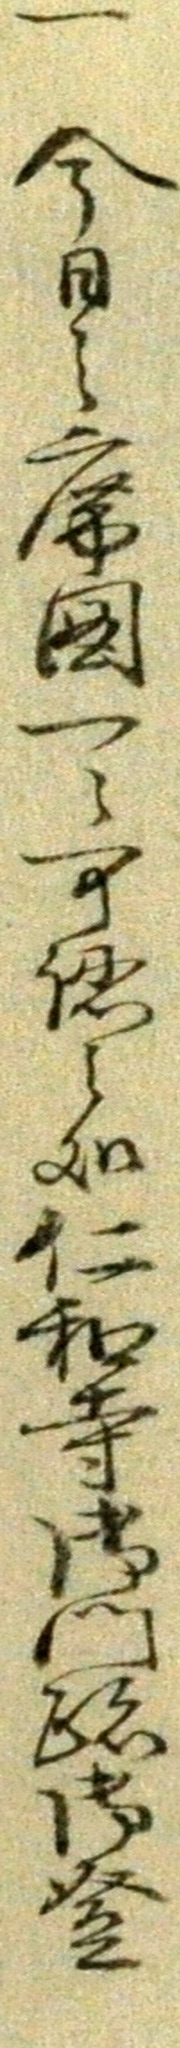一今日之席図一々可認之処仁和寺御門跡御登
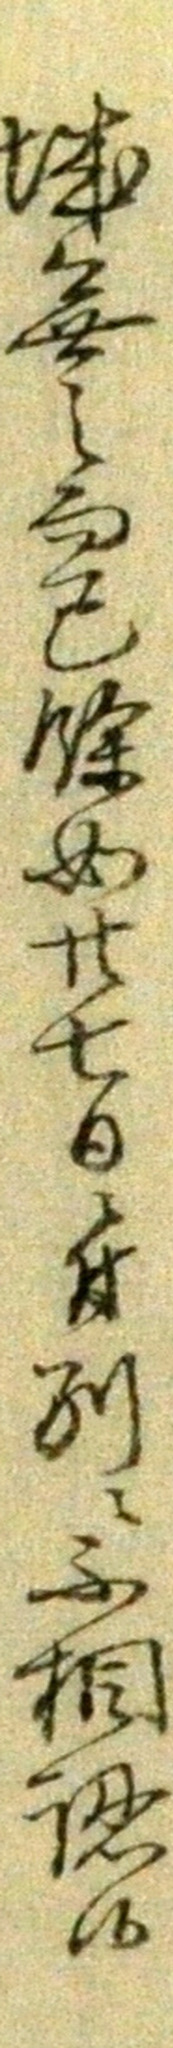城無之而己余如廿七日ニ付別ニ不相認候

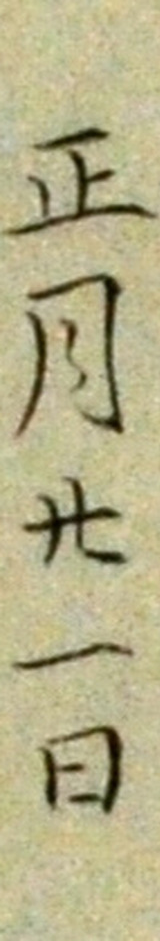正月廿一日
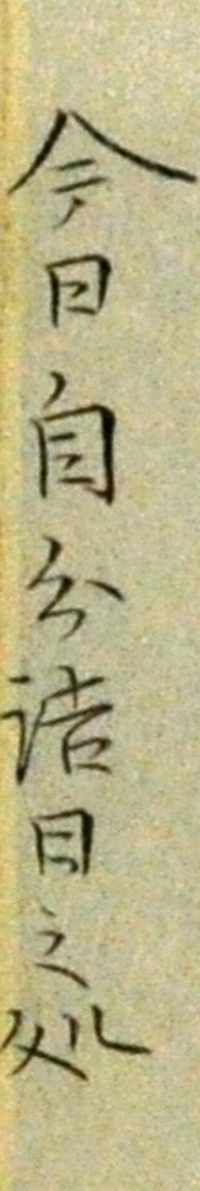一今日自分詰日之処
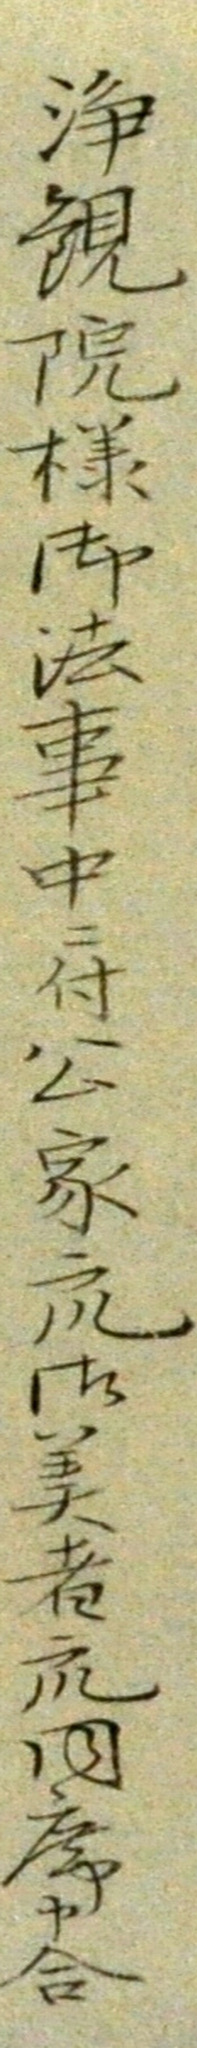浄観院様御法事中ニ付公家衆御奏者衆同席申合
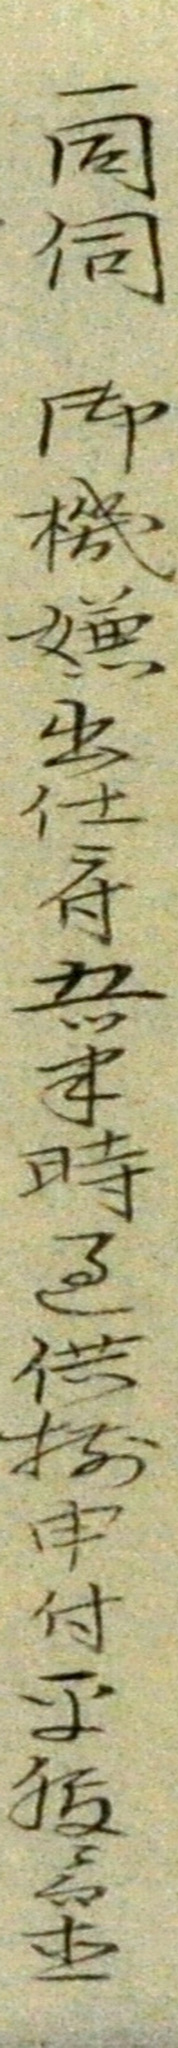一同伺御機嫌出仕ニ付五ツ半時過供揃申付平服ニ而直
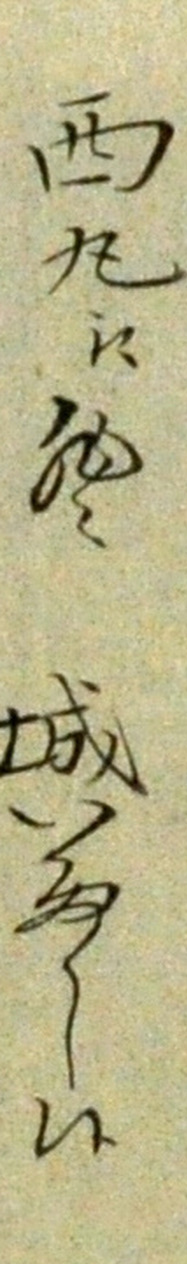西丸え登城いたし候
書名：諸留書〔一括〕
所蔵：伊那市立高遠町図書館・合同会社AMANE
